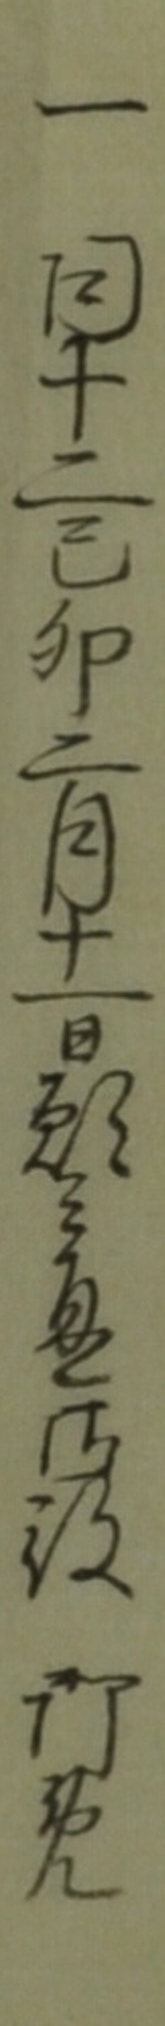一同十一己卯二月十一日願之通御役御免
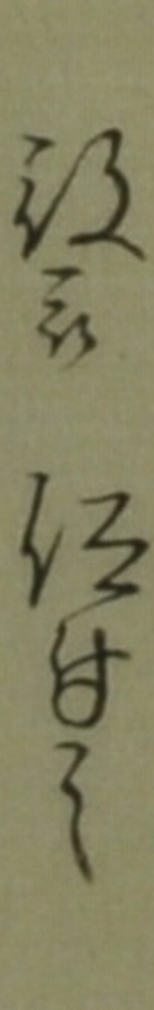役被仰付之
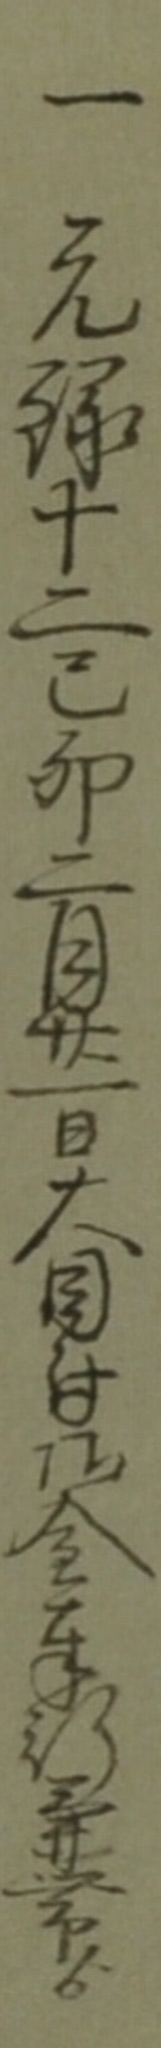一元禄十二己卯二月廿一日大目付御金奉行兼帯ゟ
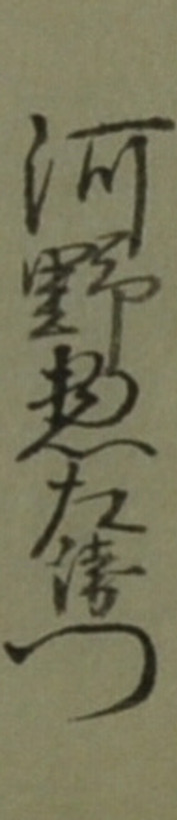河野惣左衛門
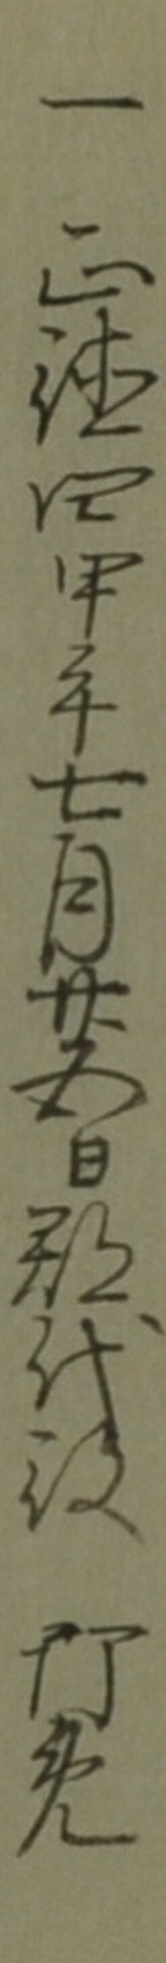一正徳四甲午七月廿五日郡代役御免
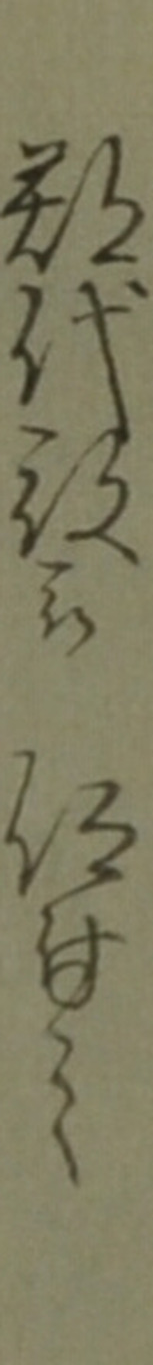郡代役被仰付之
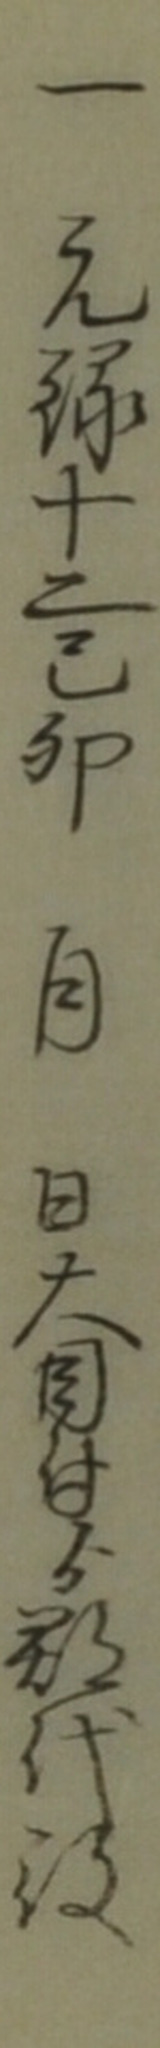一元禄十二己卯月日大目付ゟ郡代役
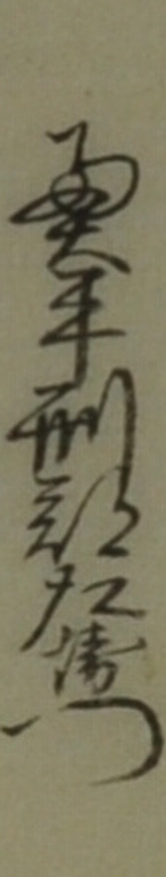奥平刑部左衛門
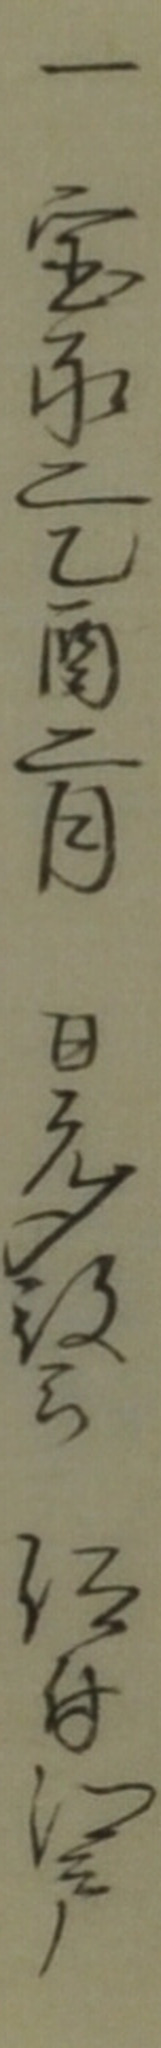一宝永二乙酉二月日元〆役被仰付江戸
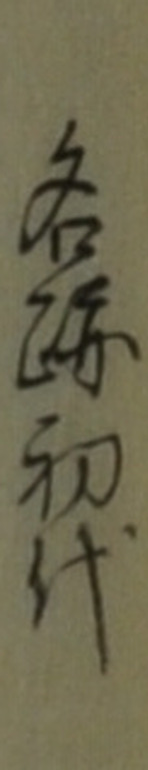名跡初代
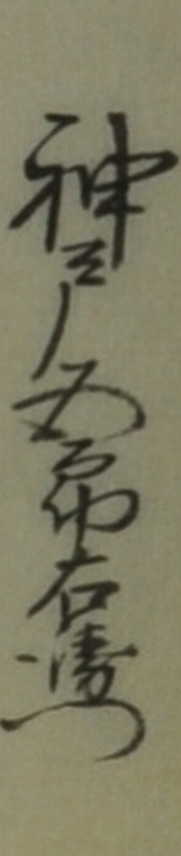神戸五郎右衛門
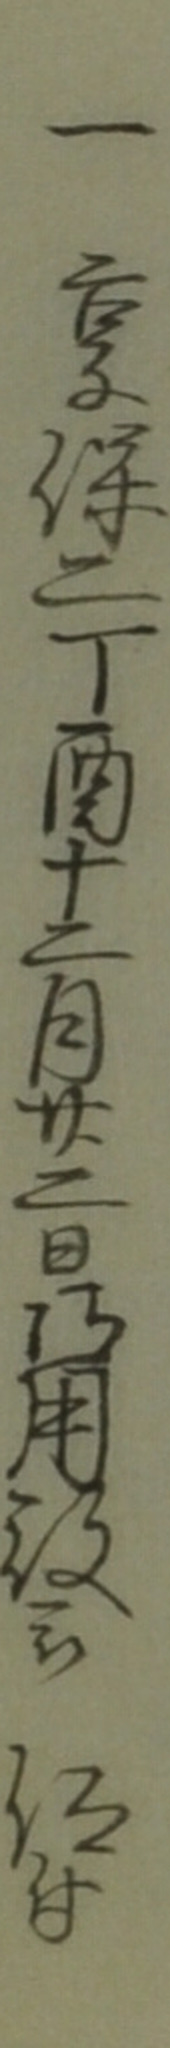一享保二丁酉十二月廿二日御用役被仰付
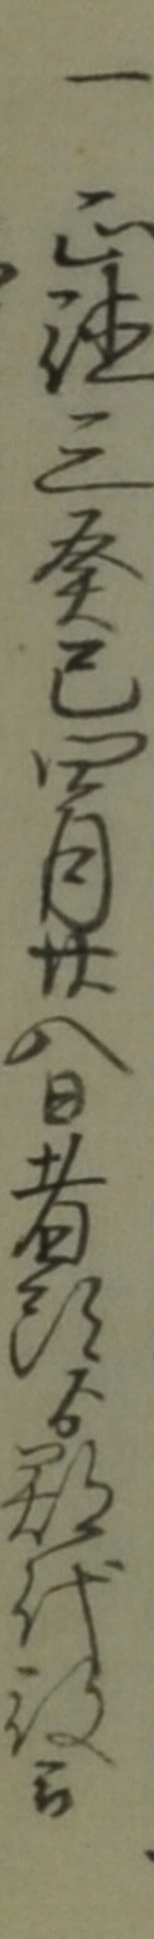一正徳三癸巳四月廿八日者頭ゟ郡代役被
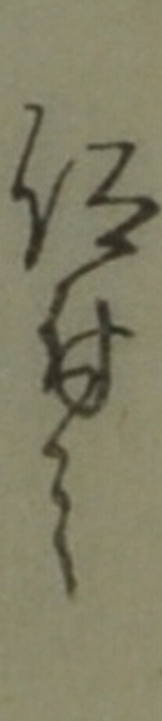仰付之
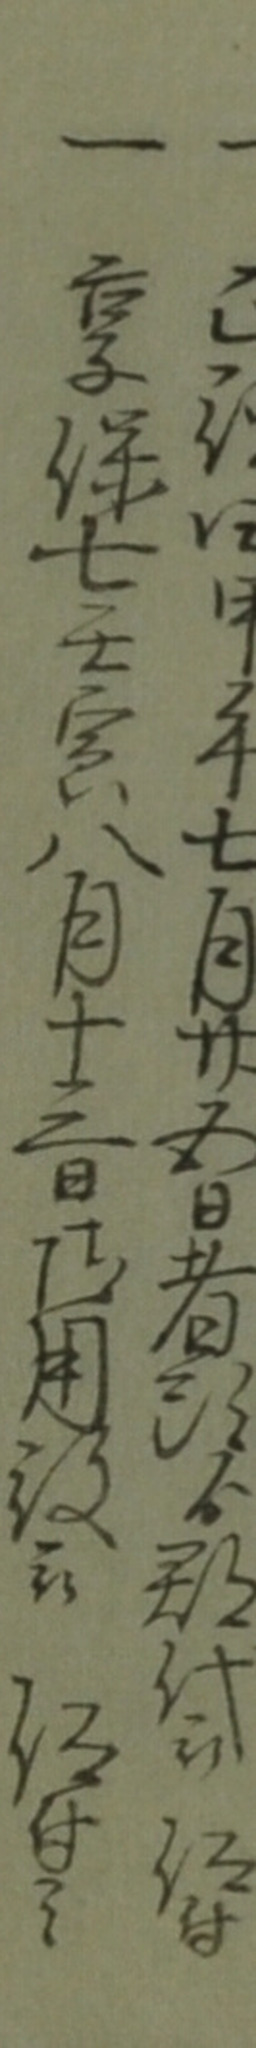一享保七壬寅八月十三日御用役被仰付之
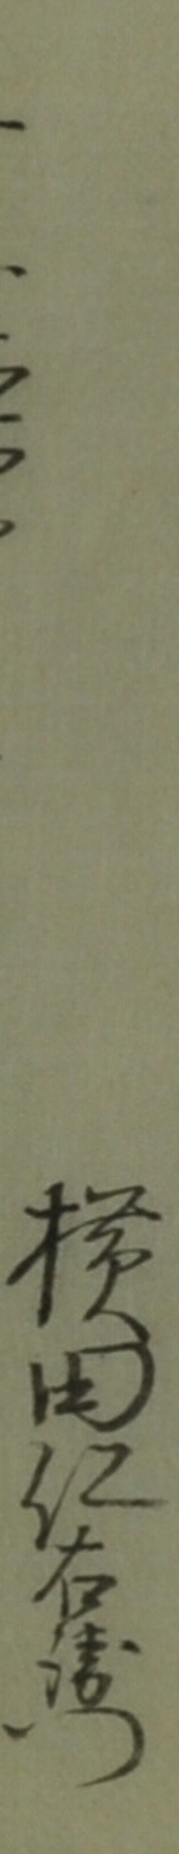横田仁右衛門
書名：諸御役代々録（二）
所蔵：伊那市立高遠町図書館・合同会社AMANE
